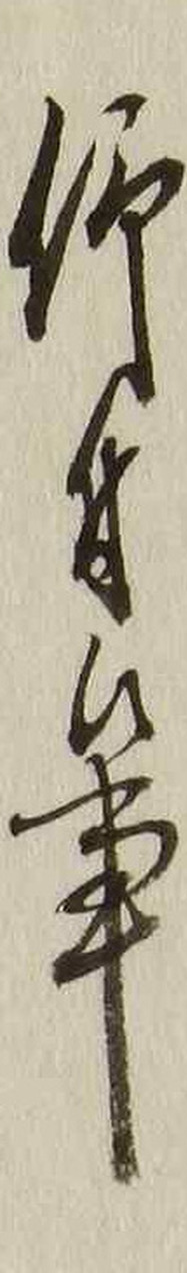仰付候事
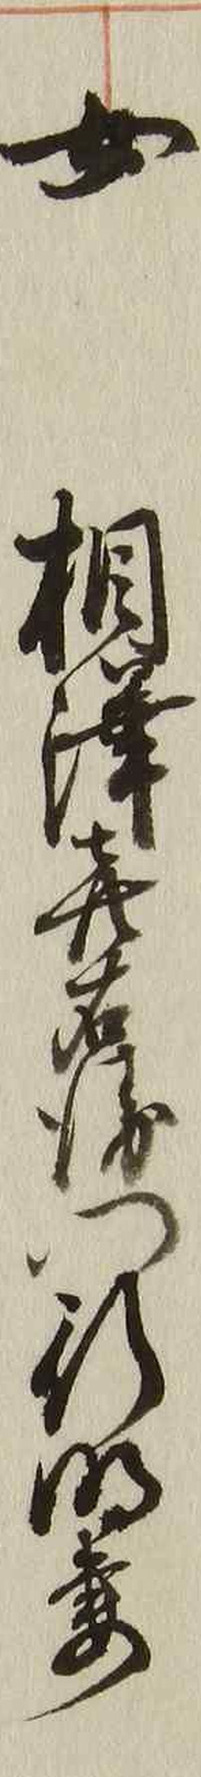女相沢喜右衛門行明妻
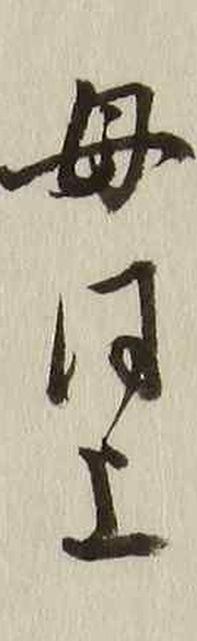母同上
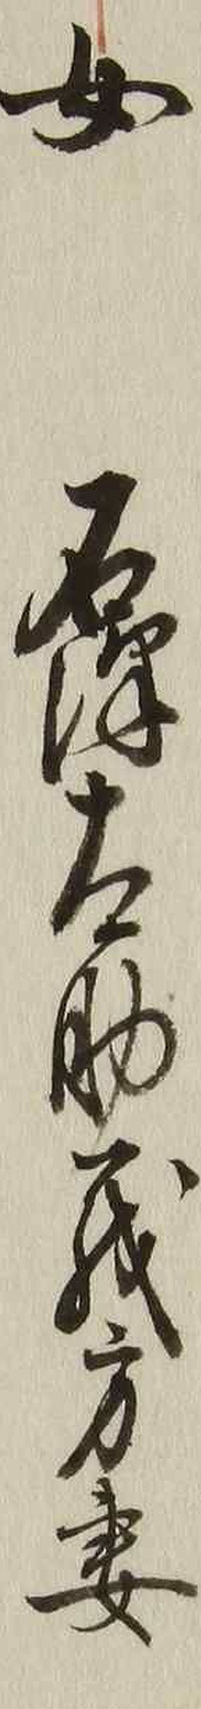女石沢太助義方妻
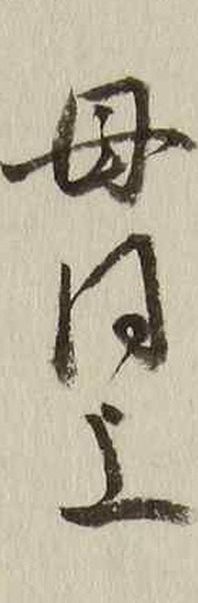母同上
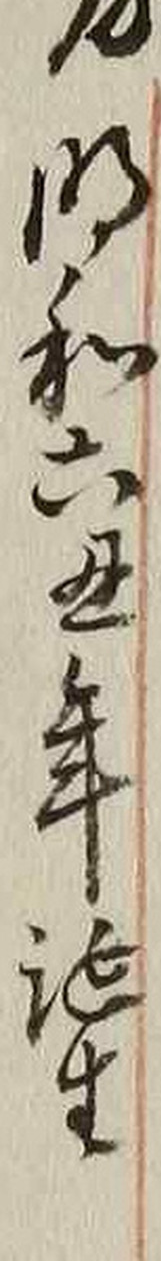明和六丑年誕生
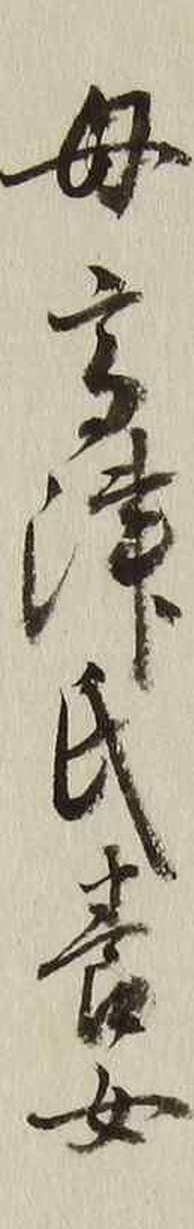母高津氏養女
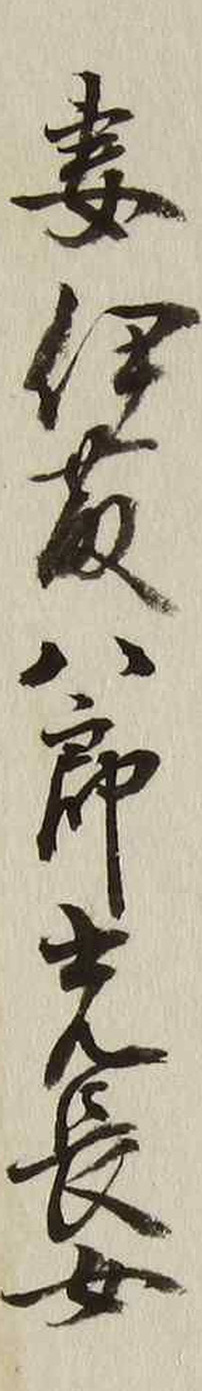妻伊藤八郎光長女
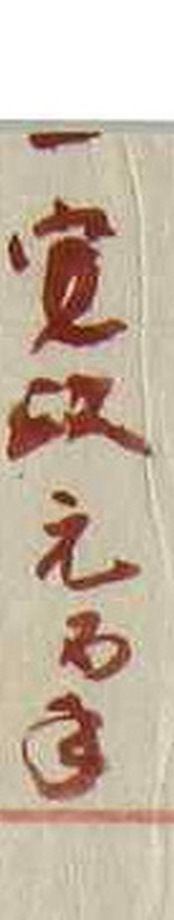一寛政元酉年
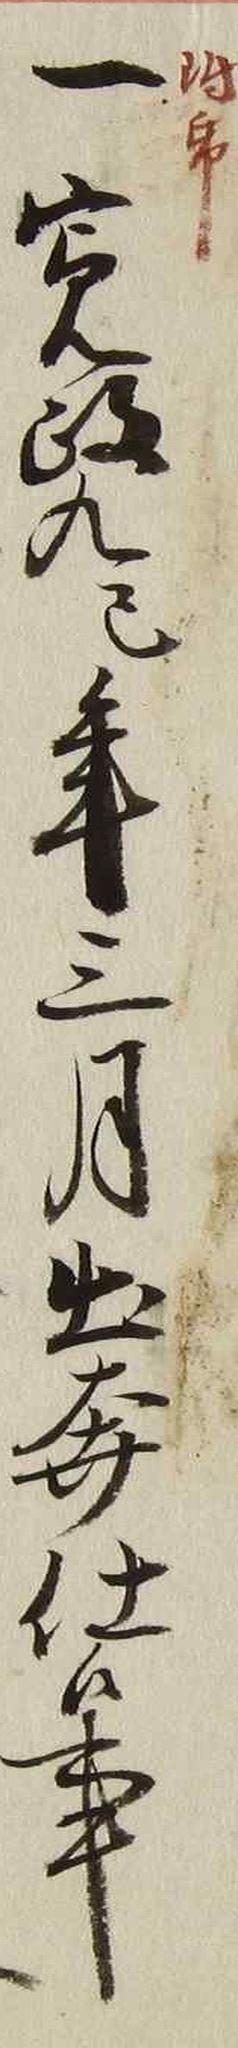一寛政九巳年三月出奔仕候事
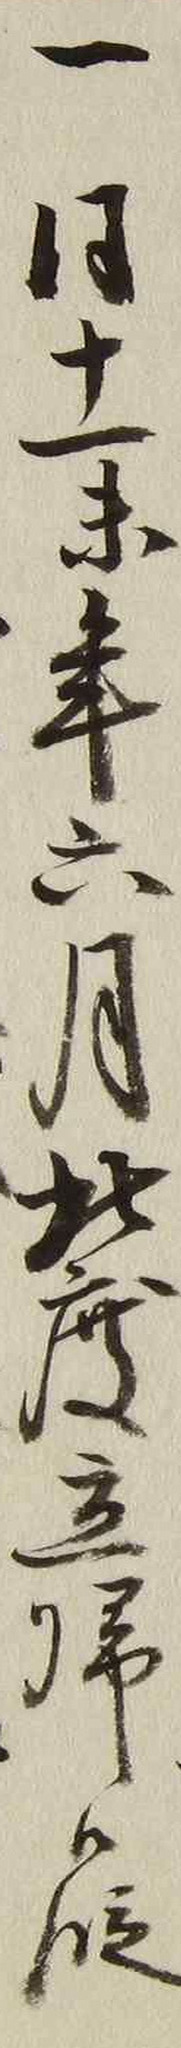一同十一未年六月此度立帰候段
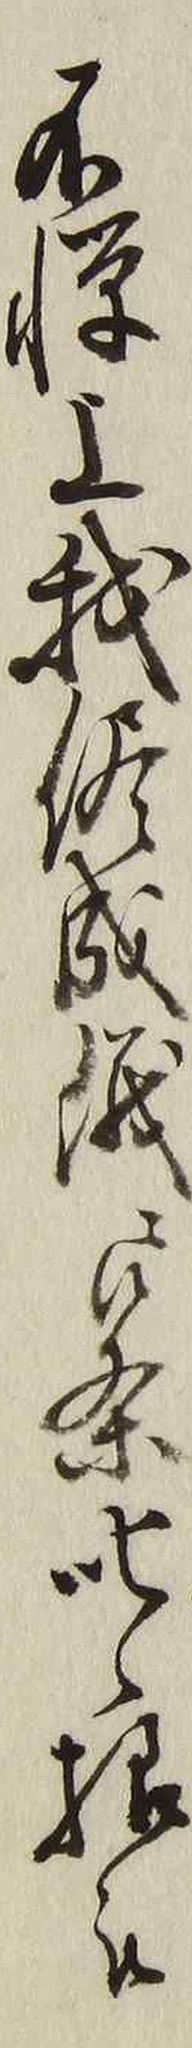不憚上我侭成儀ニ候条叱候様被
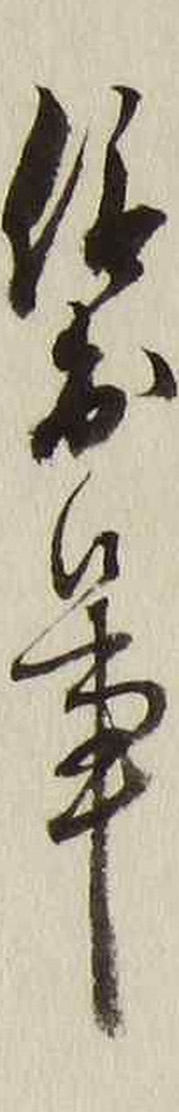仰出候事
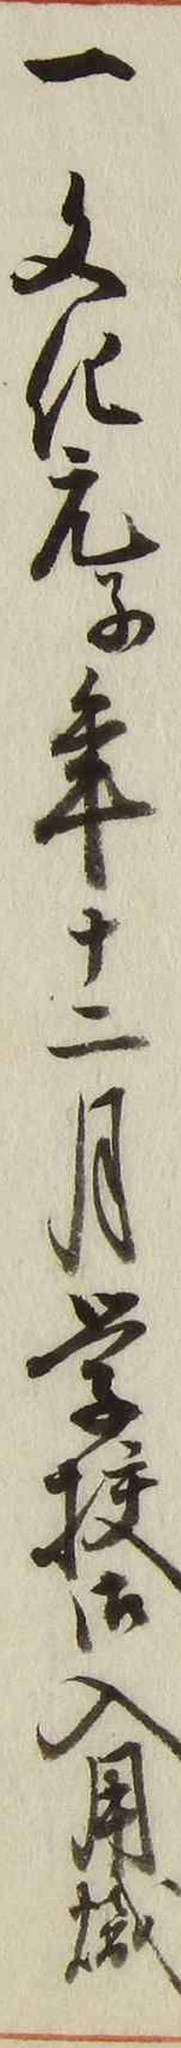一文化元子年十二月学校御入用熾

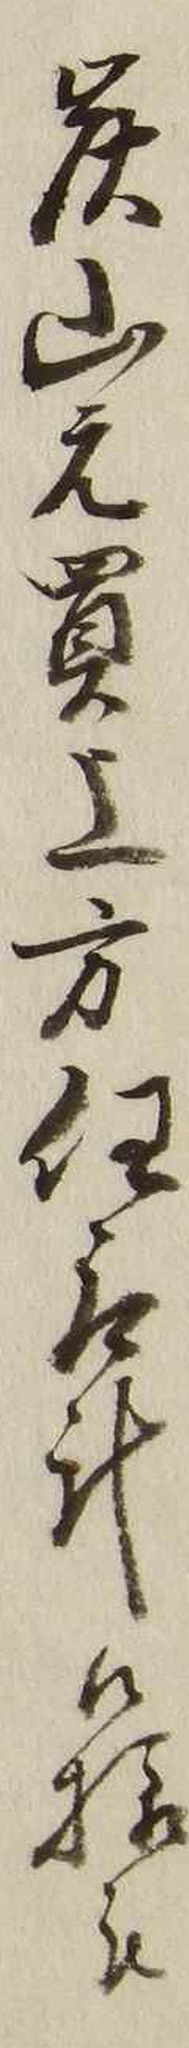炭山元買上方任取計候様被
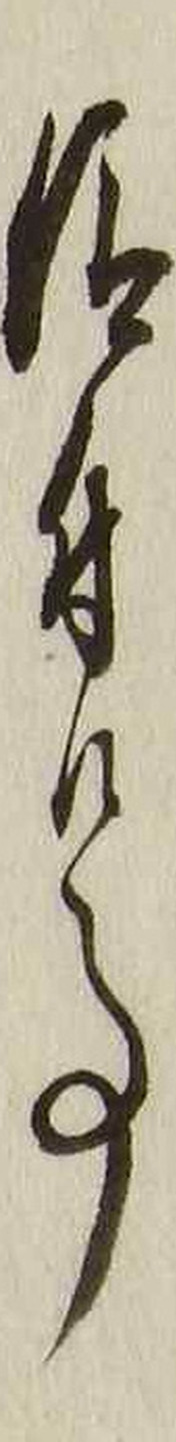仰付候事
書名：諸士系譜　巻之27　い之部27
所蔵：会津若松市立会津図書館
